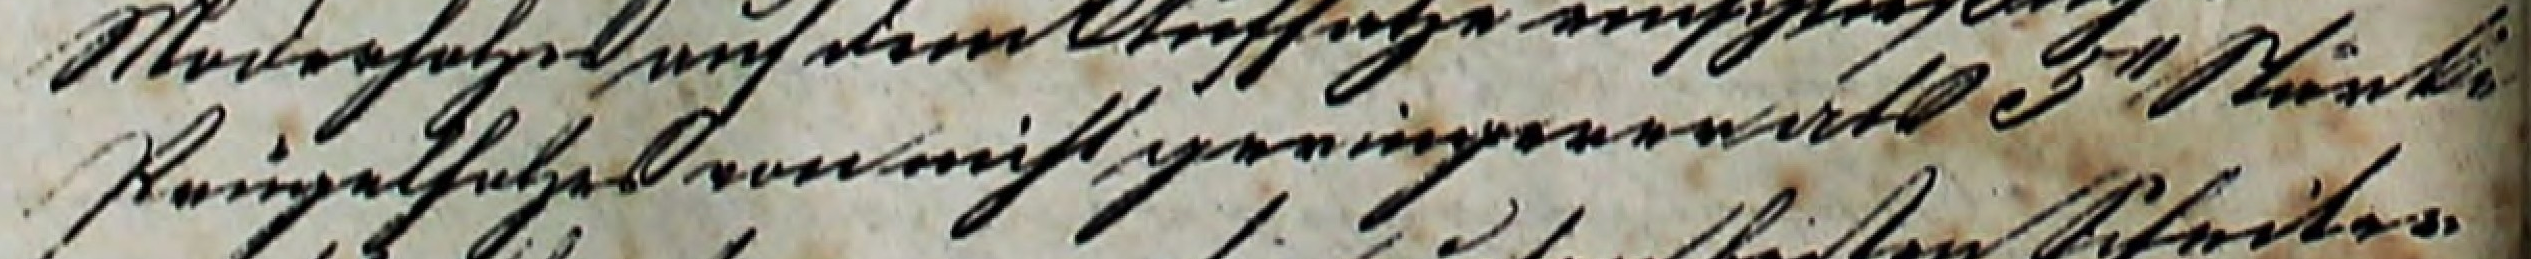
Prügelholzes von nicht geringererats 5?? Stürks„
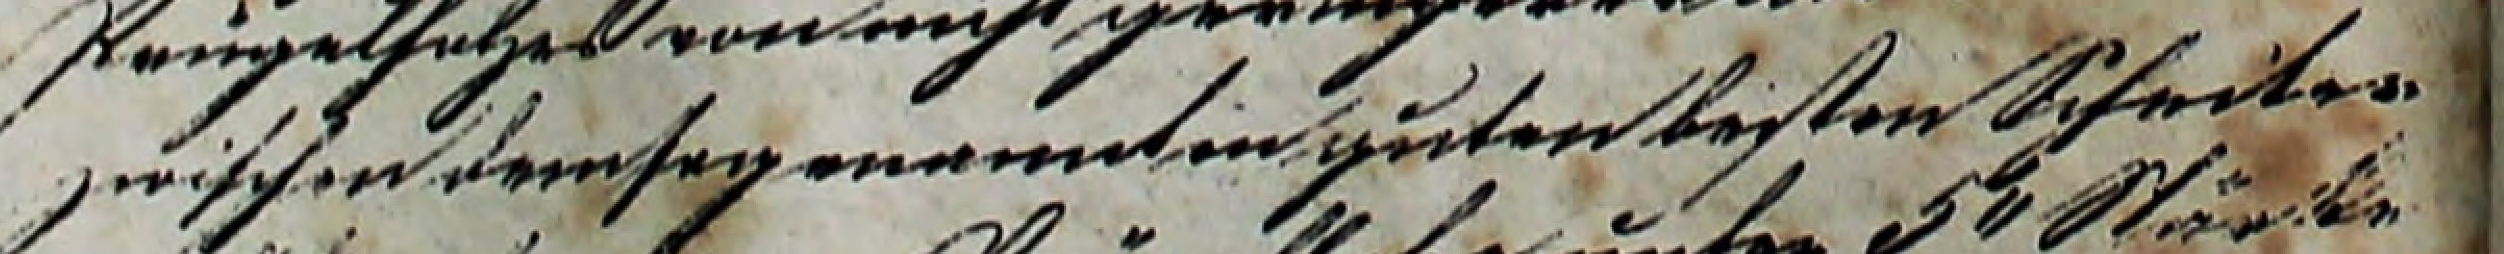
zwischen demsegenannt in guten besten Scheiter
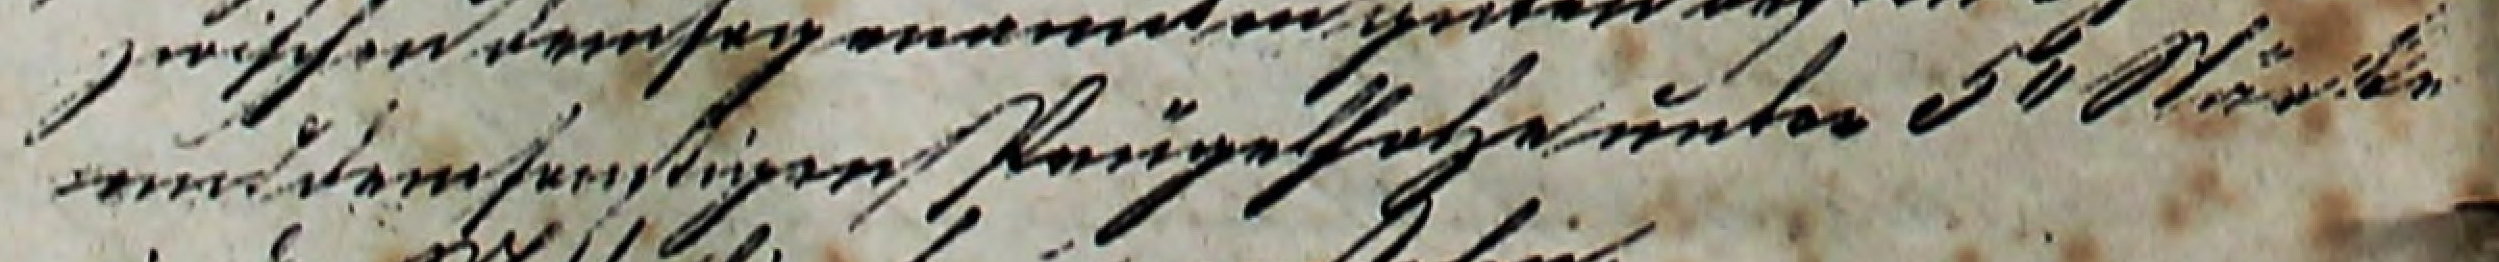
und demsenstigen Prügelholze unter 5?? Närke
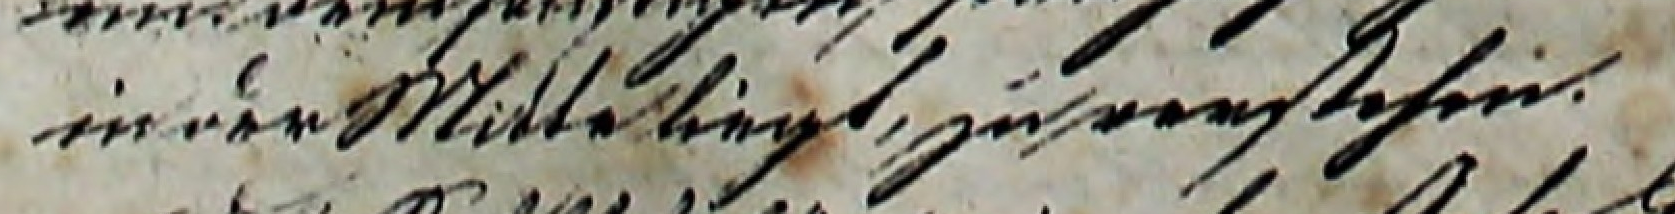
in der Mitteliegt, zu verstehen.
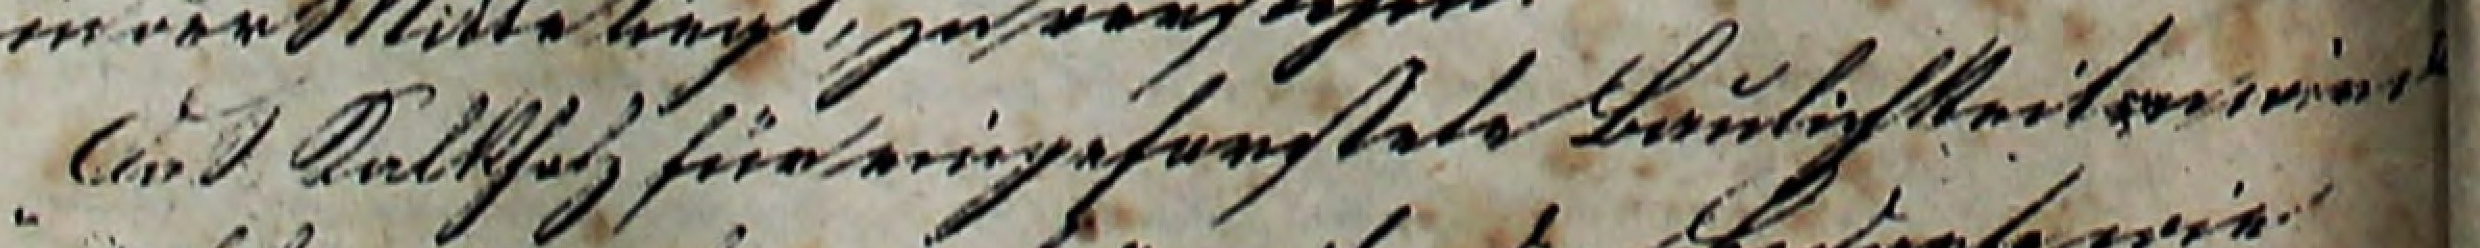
??? Kalkholz für eingafarstele Baulichkeiten ???
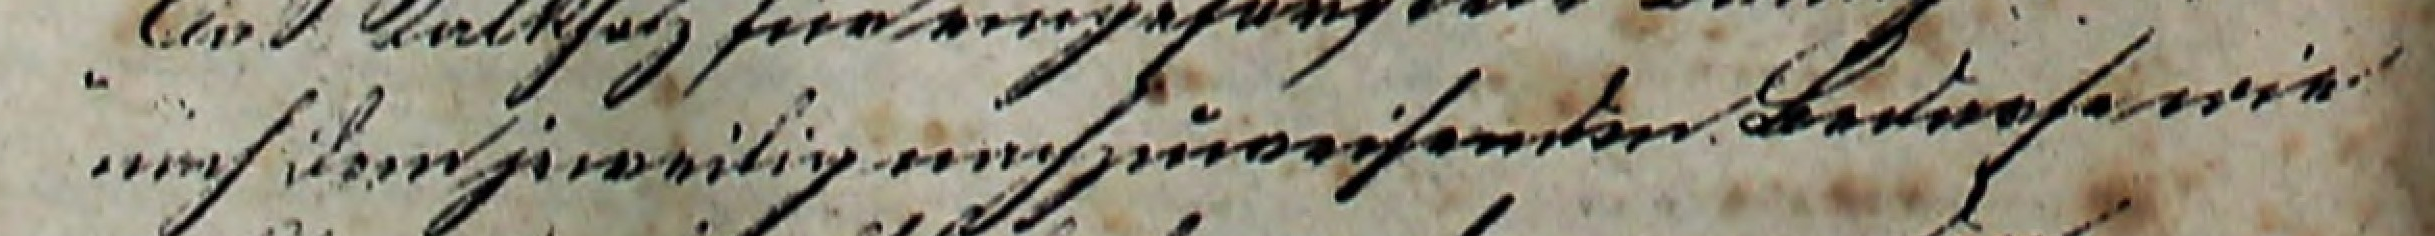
??? dem jeweitig nachzuweisenden Bed??
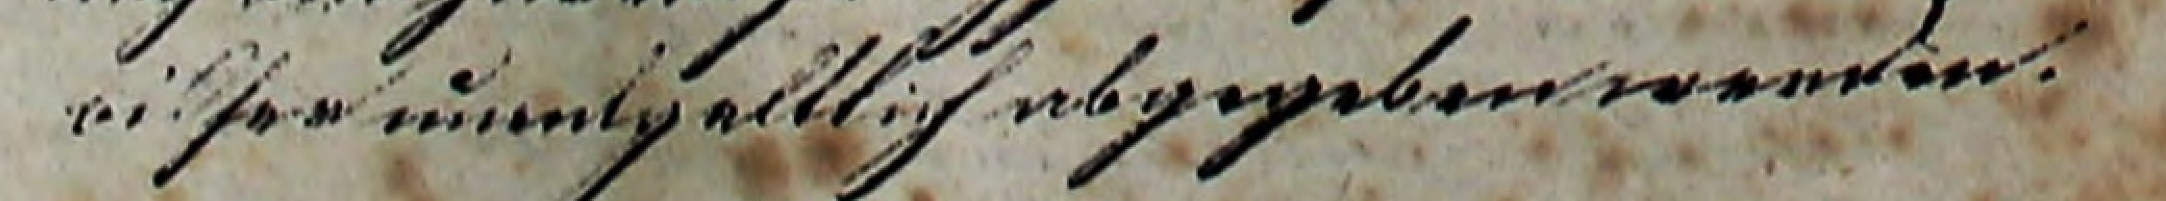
?fer unentgeltlich abgegeben werden.
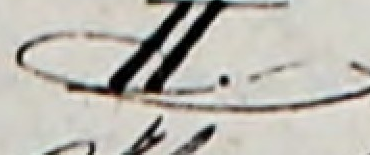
II.
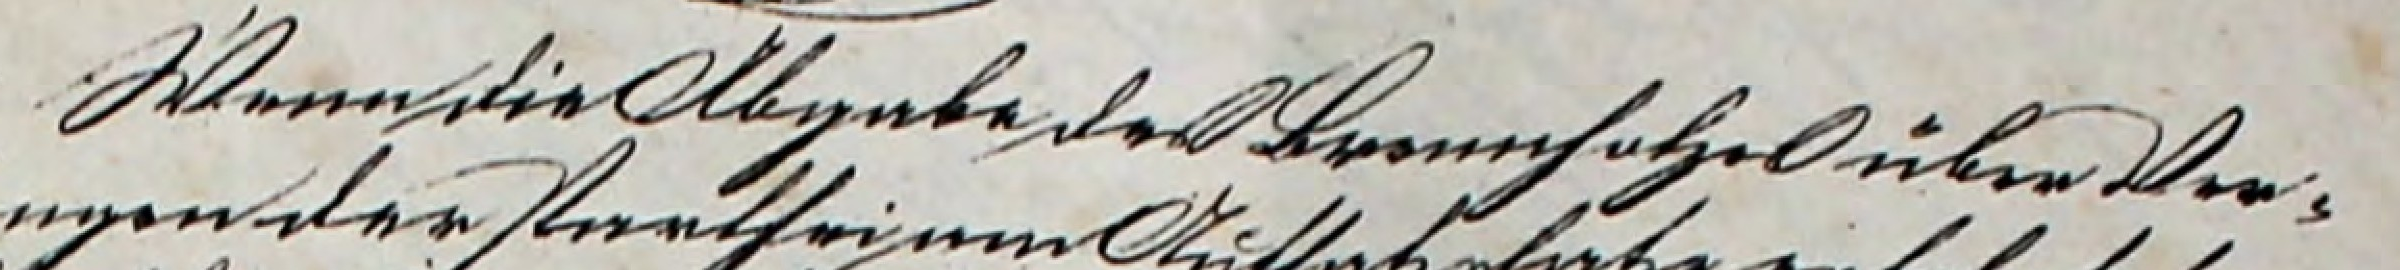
Wenn die Abgabe des Brennholzes über Ver„
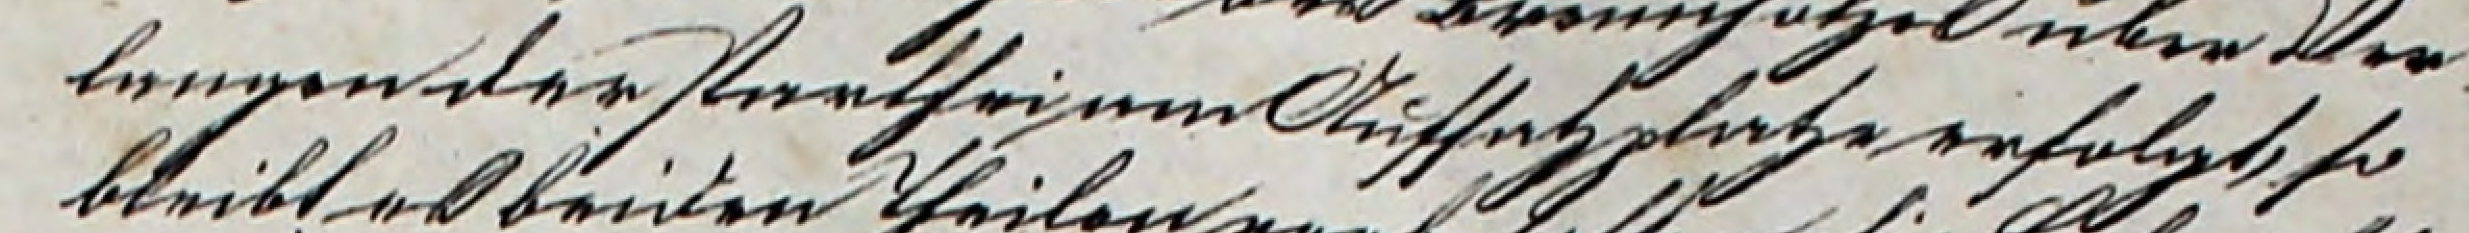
langen der Parthei am Aussatzglatze erfolgb. so
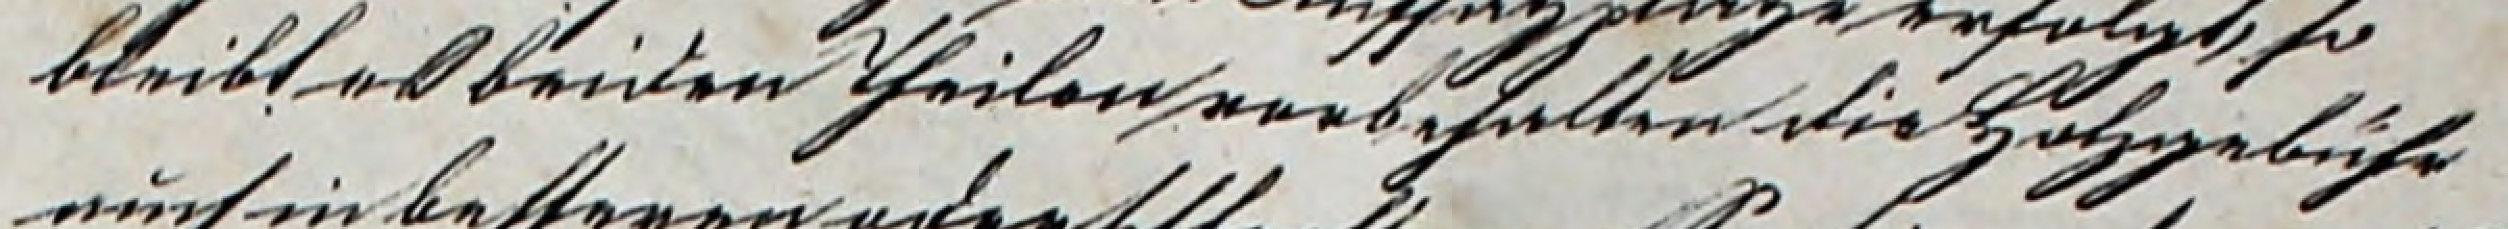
bleibt es beiden Theilen vorbehalten die Holzgebühr
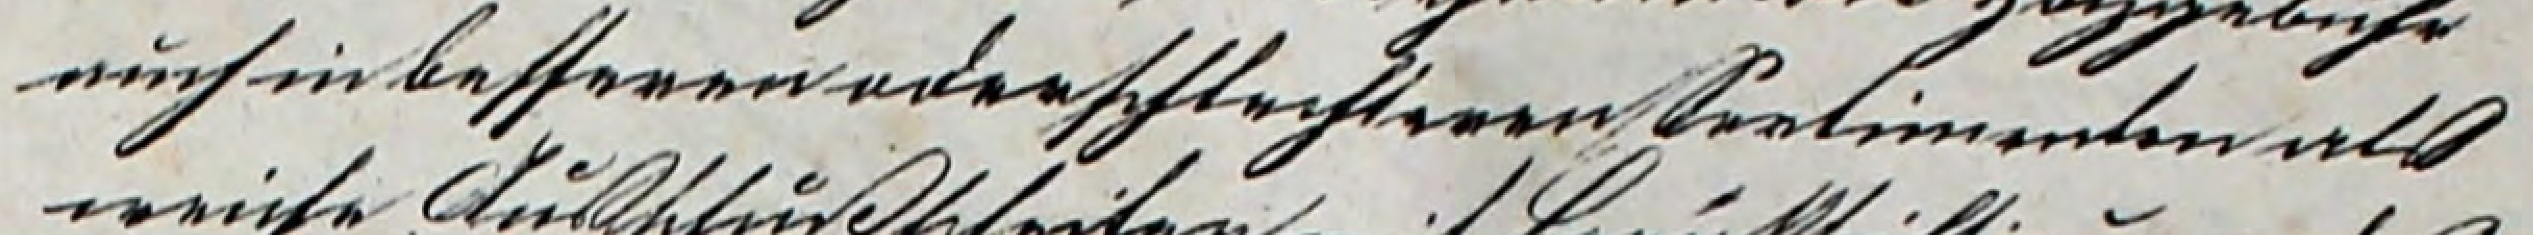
auch in besseren oder schlechteren Sertimenten als
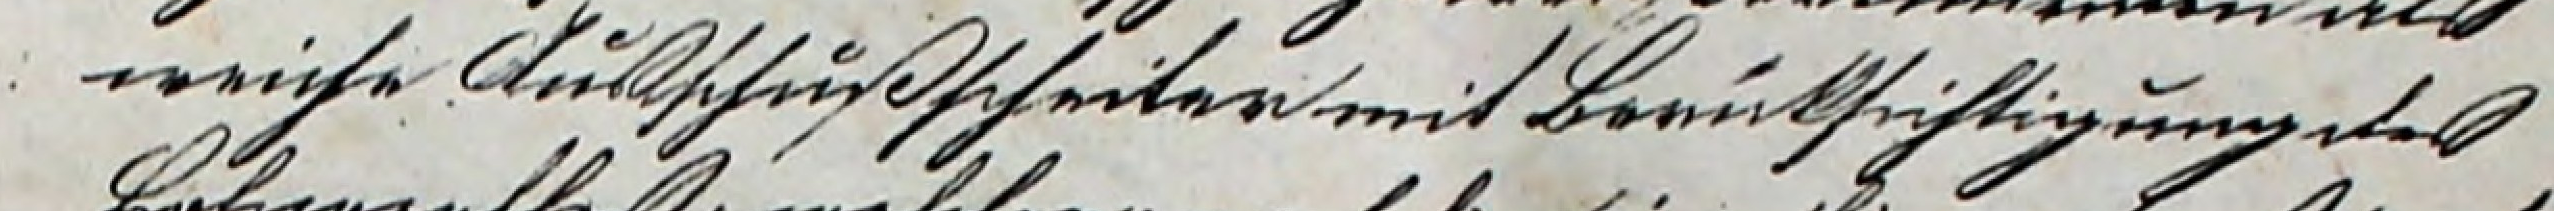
weiche Ausschlußschleiter mit Brennksichtigung des
